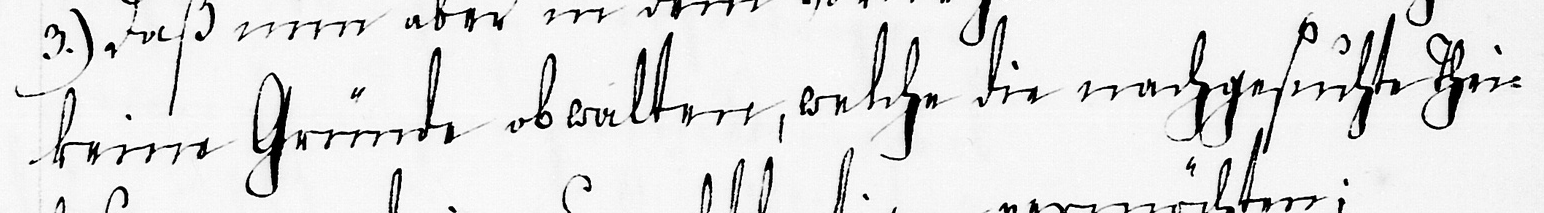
keine Gründe obwalten, welche die nachgesuchte Thei¬
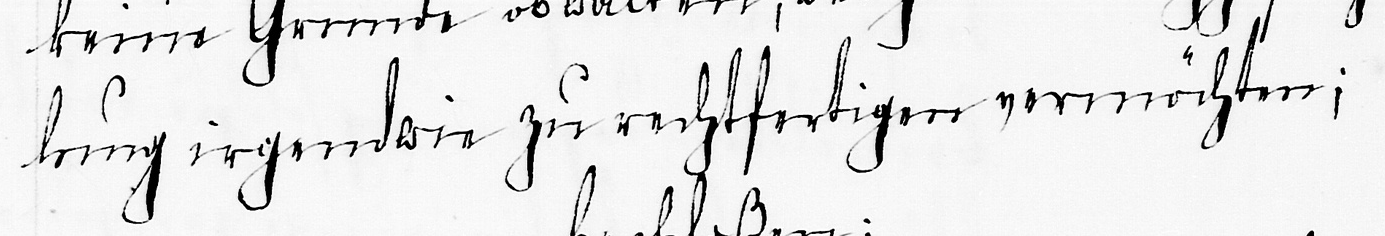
lung irgendwie zu rechtfertigen vermöchten;
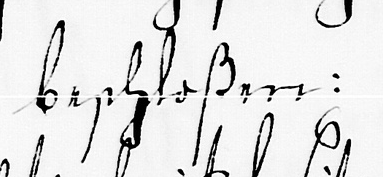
beschloßen:
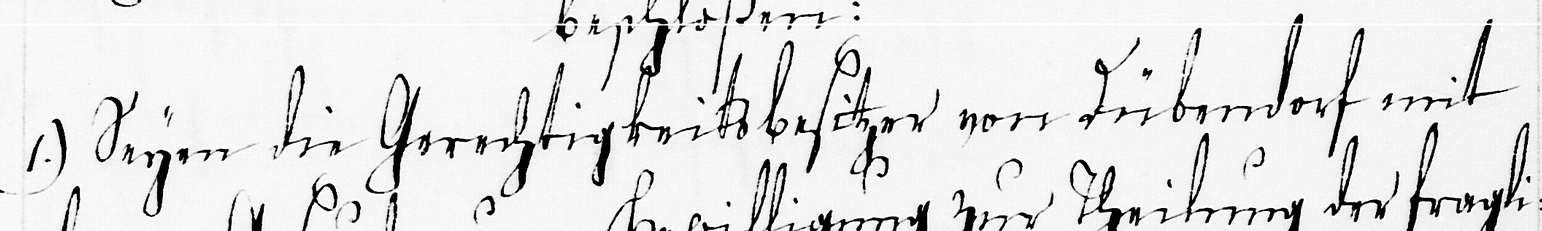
1.) Seyen die Gerechtigkeitsbesitzer von Dübendorf mit
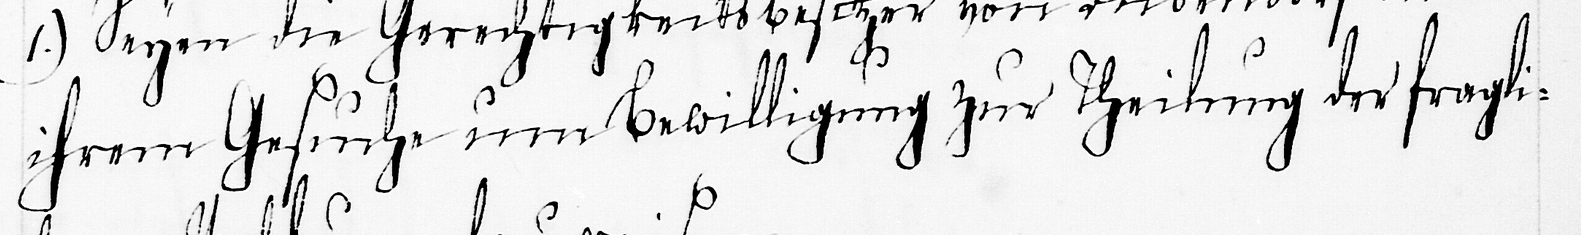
ihrem Gesuche um Bewilligung zur Theilung der fragli¬
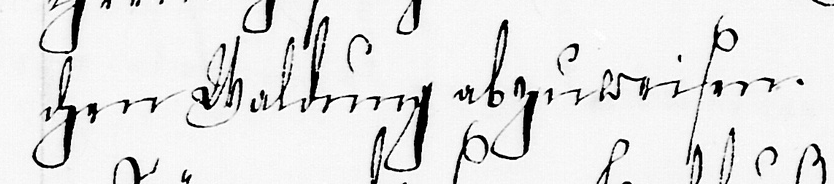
chen Waldung abzuweisen.
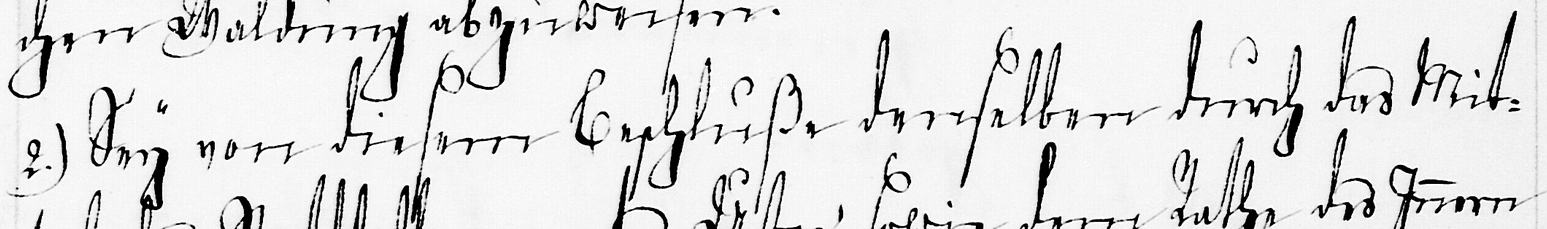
2.) Sey von diesem Beschluße denselben durch das Mit¬
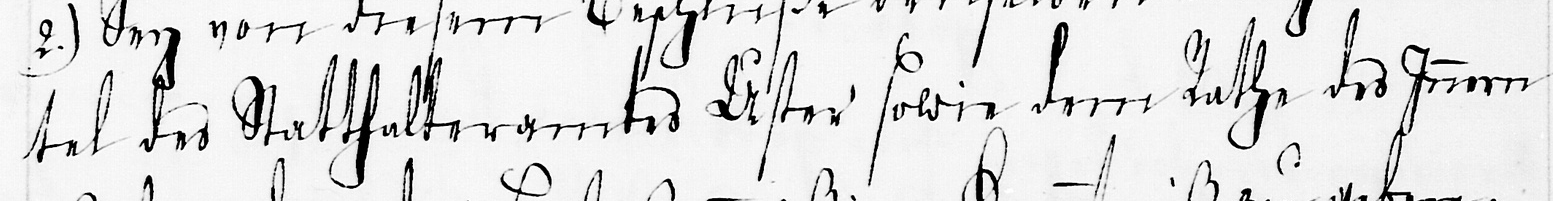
tel des Statthalteramtes Uster sowie dem Rathe des Innern
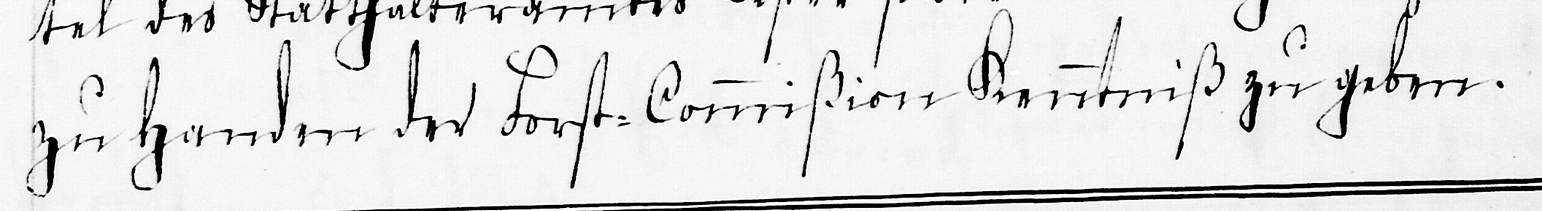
zu Handen der Forst-Commißion Kenntniß zu geben.
